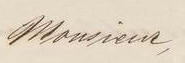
Monsieur,
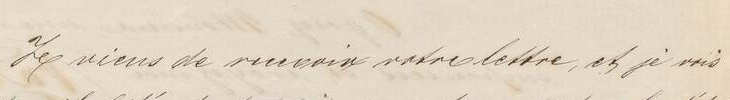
Je viens de recevoir votre lettre, et je vois
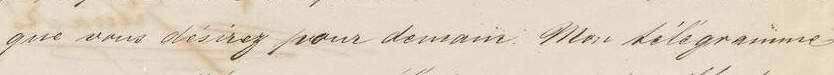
que vous désirez pour demain. Mon télégramme
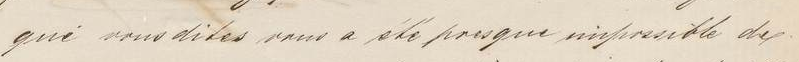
que vous dites vous a été presque impossible de
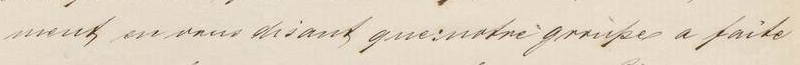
ment en vous disant que: notre groupe a faite
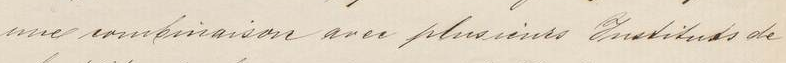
une combinaison avec plusieurs Instituts de
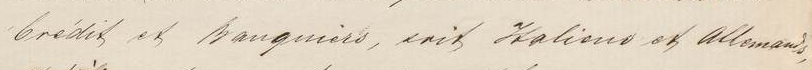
Crédit et Banquiers, soit Italiens et Allemands,
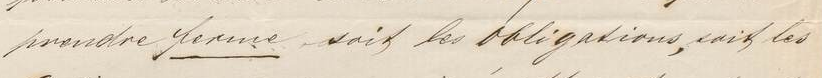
prendre ferme soit les Obligations, soit les
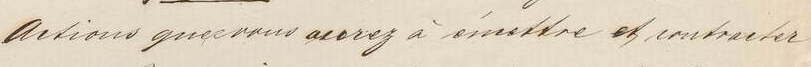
Actions que vous aurez à émettre et contracter
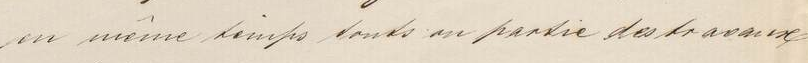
en même temps touts au partie des travaux
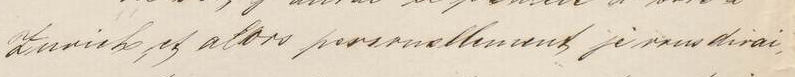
Zurich, et alors personellement je vous dirai,
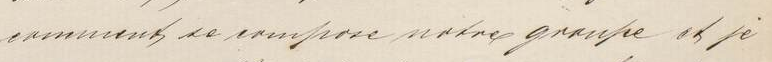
comment se compose notre groupe et je
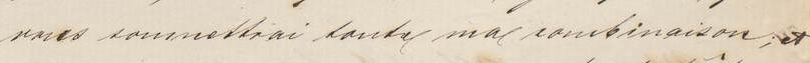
vous soumettrai toute ma combinaison; et
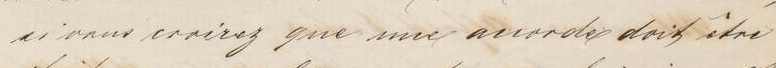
si vous croirez que une accorde doit être
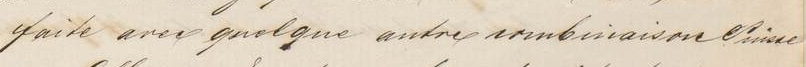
faite avec quelque autre combinaison Suisse
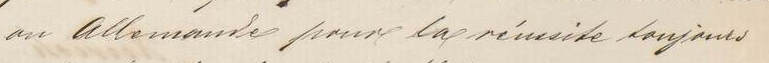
ou Allemande pour la réussite toujours
